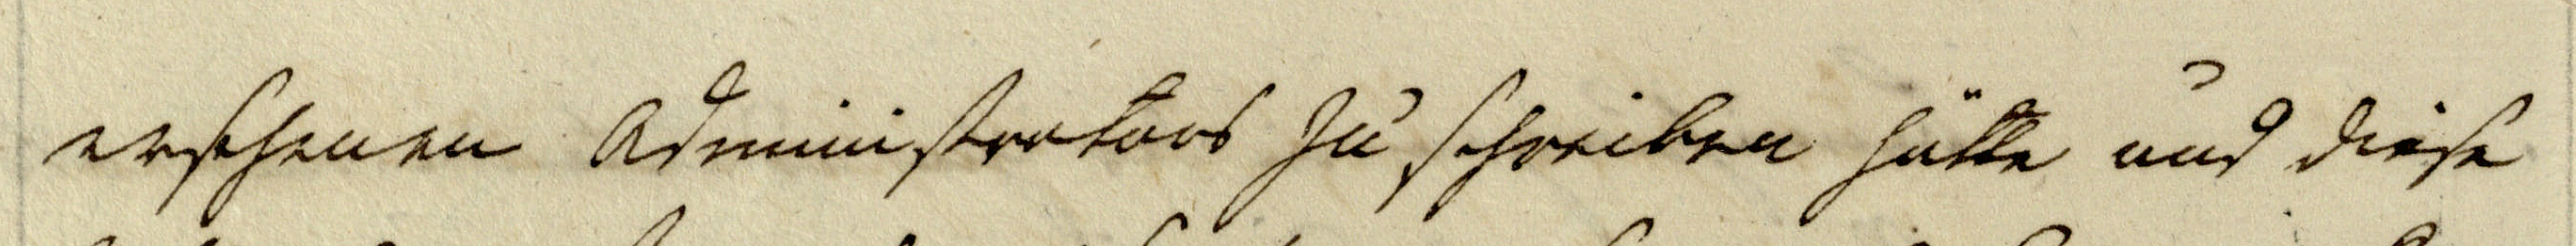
ersehenen Administrators zu schreiben hätte und diese
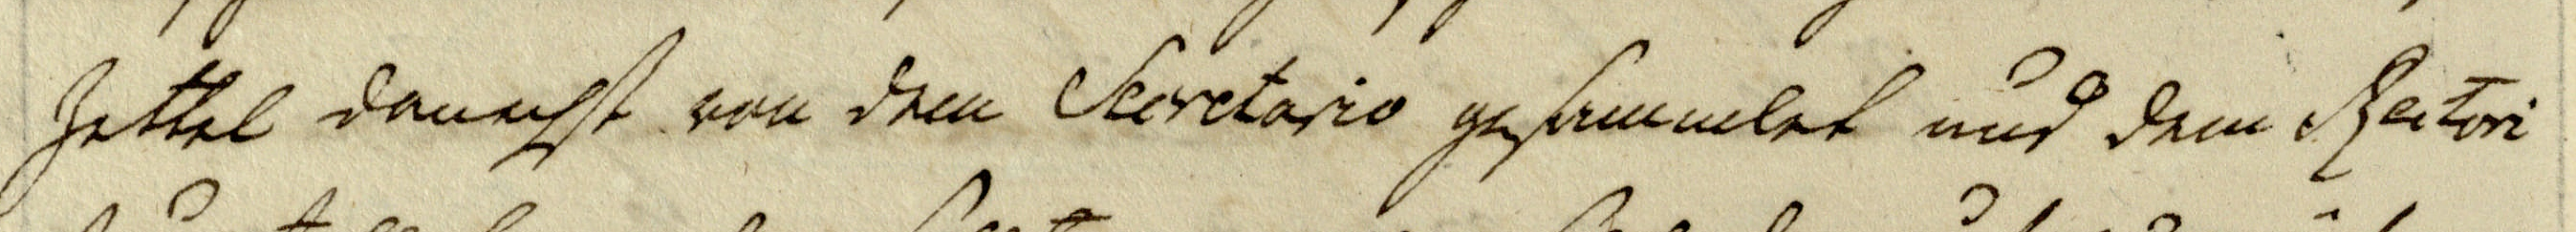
Zettel danechst von dem Secretario gesammlet und dem Rectori
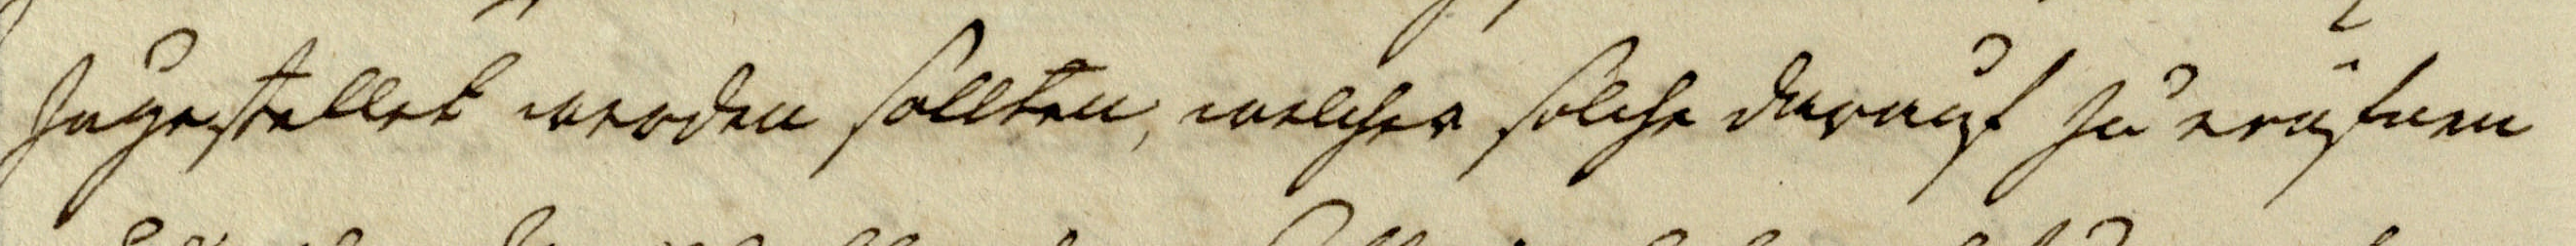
zugestellet werden sollten, welcher solche darauf zu eröfnen
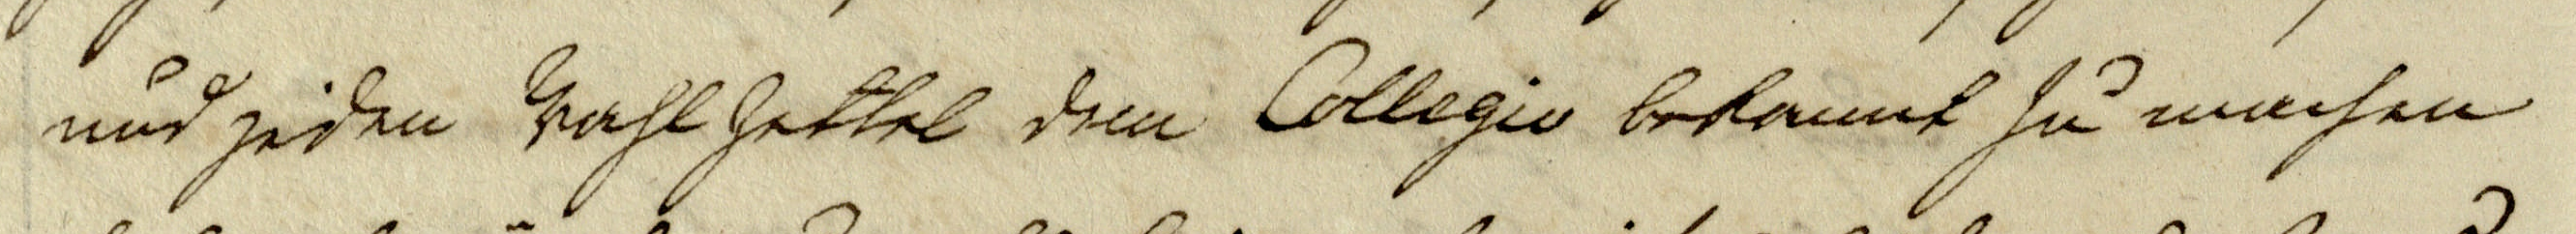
und jeden Wahl Zettel dem Collegio bekannt zu machen
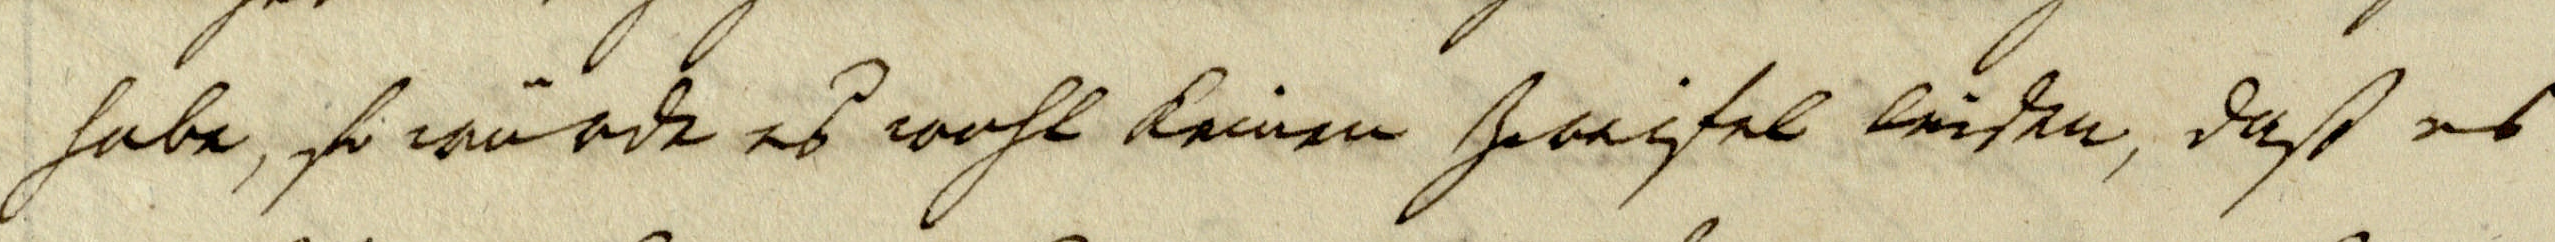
habe, so würde es wohl keinen Zweifel leiden, daß es
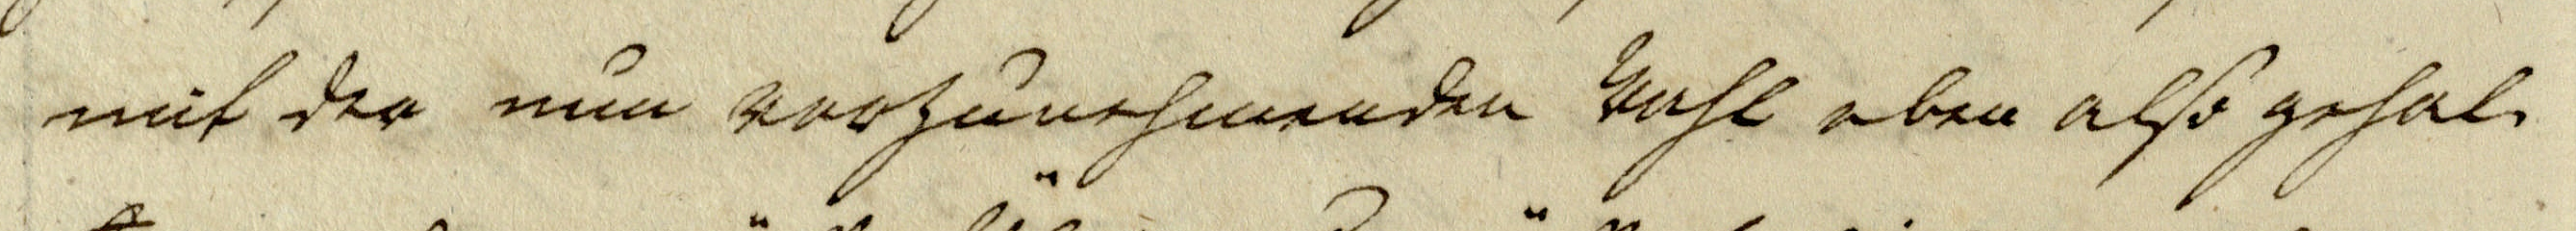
mit der nun vorzunehmenden Wahl eben also gehal¬
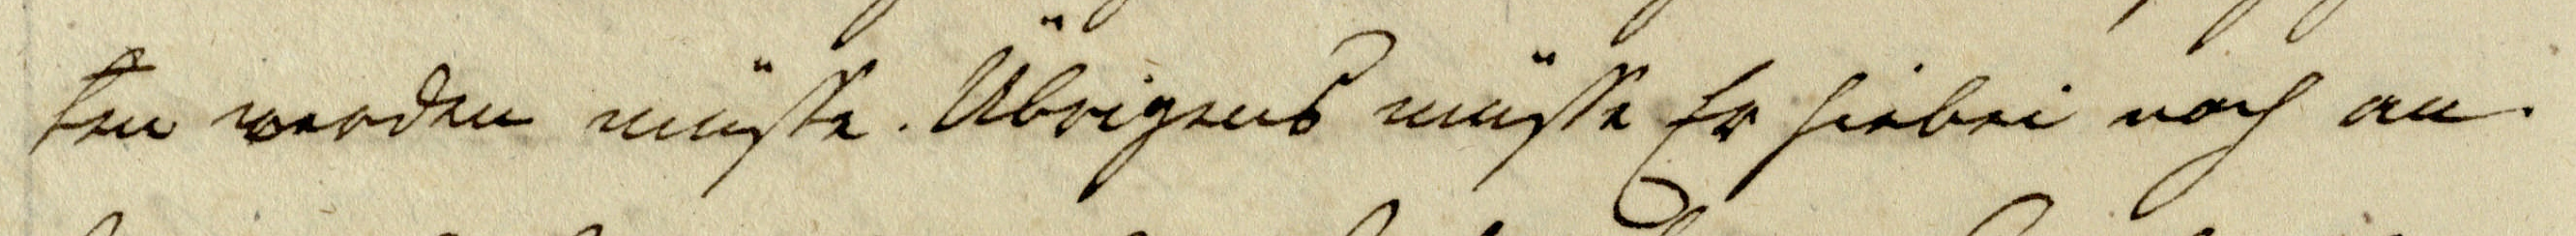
ten werden müsse. Übrigens müsse Er hiebei noch an¬
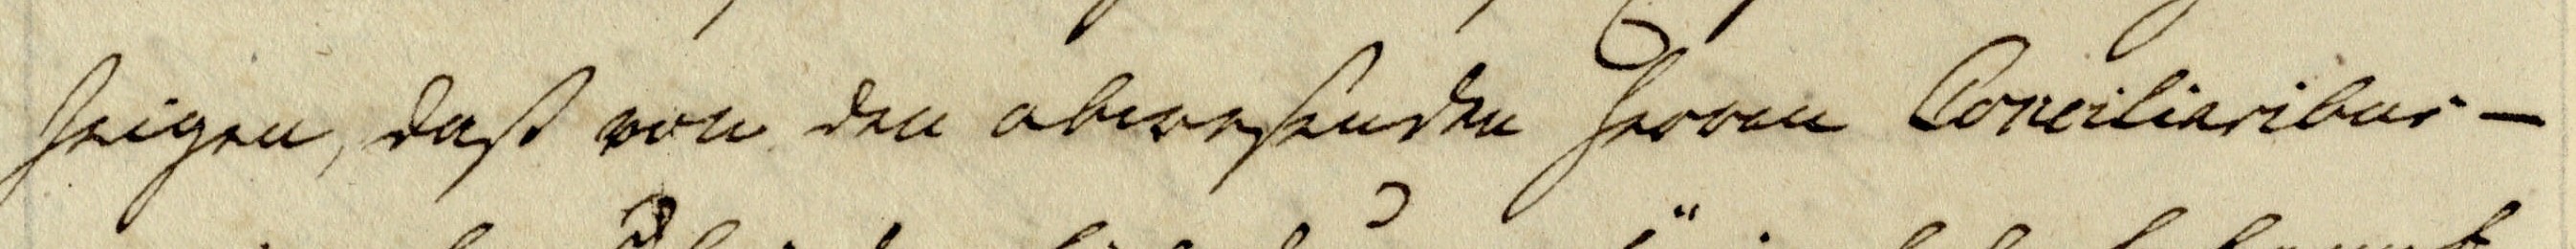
zeigen, daß von den abwesenden Herren Conciliaribus
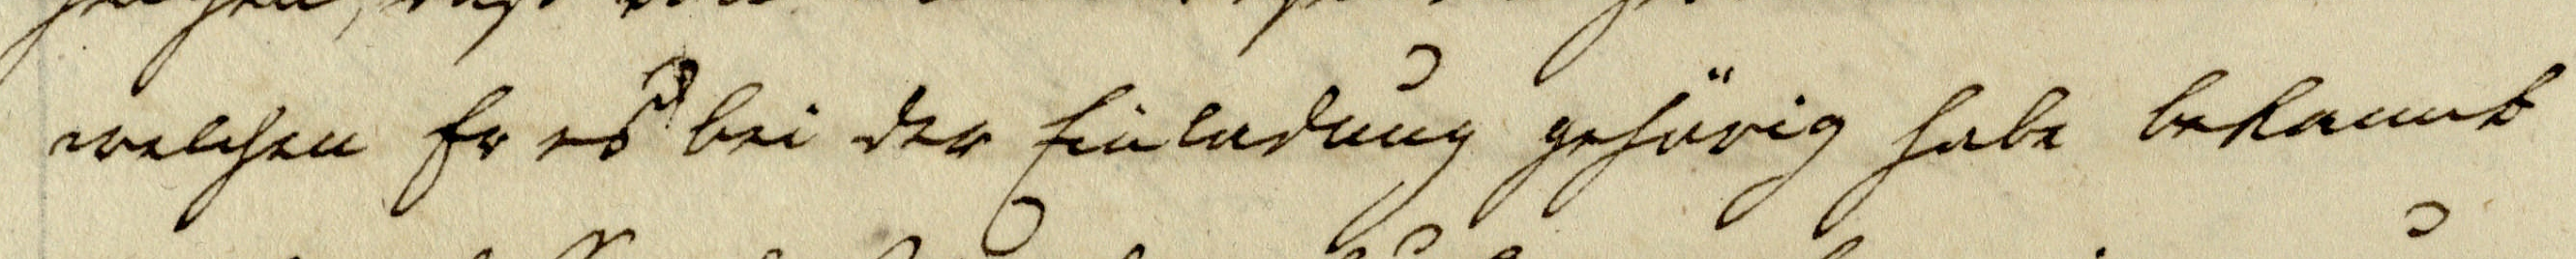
welchen Er es bei der Einladung gehörig habe bekannt
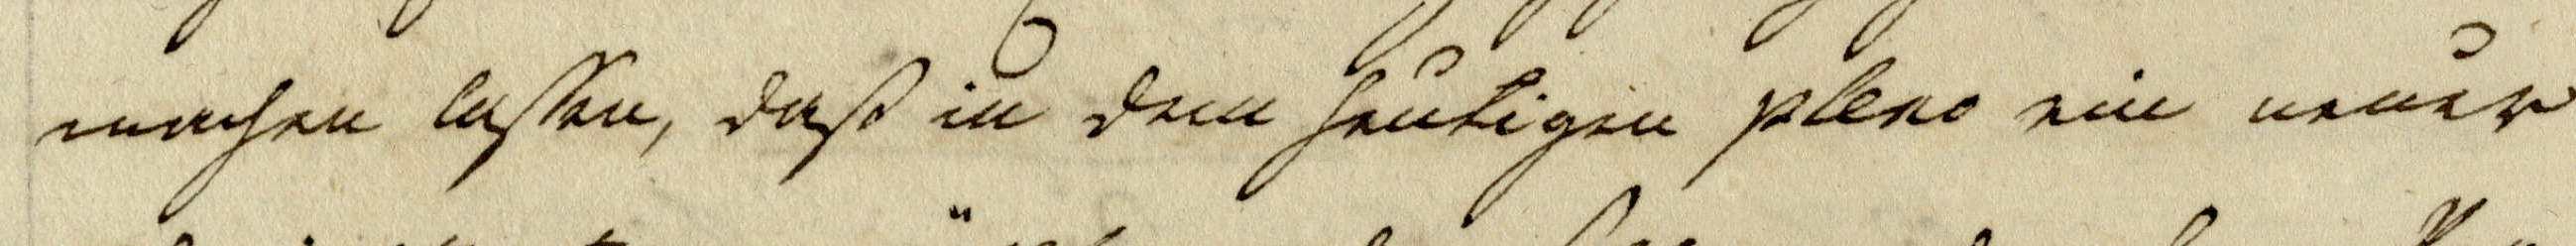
machen lassen, daß in dem heutigen pleno ein neuer
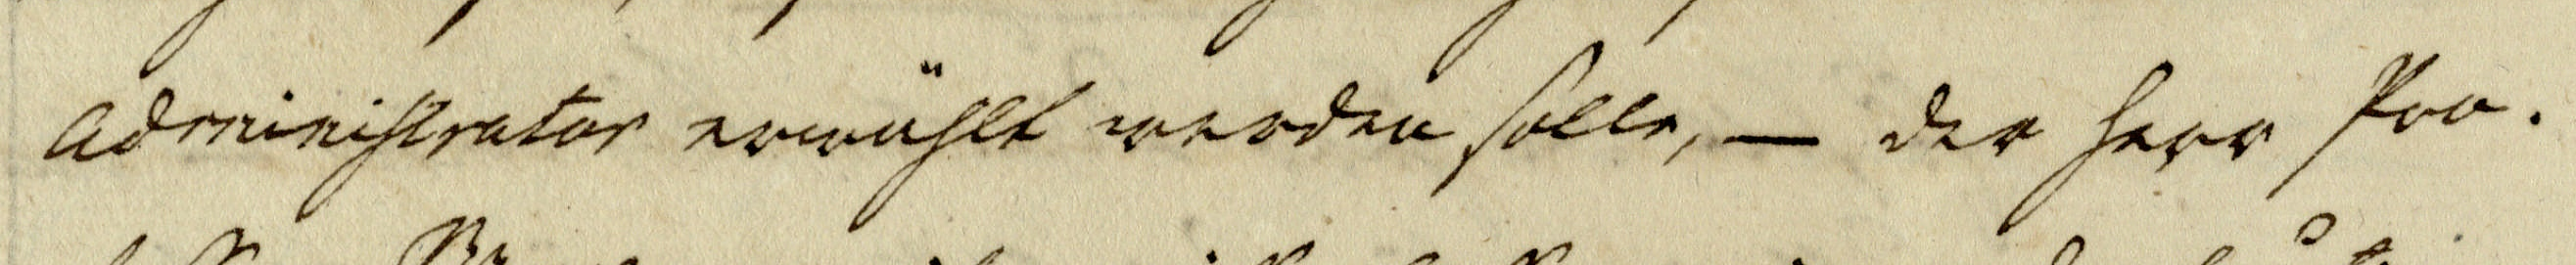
Administrator erwählt werden solle, der Herr Pro¬
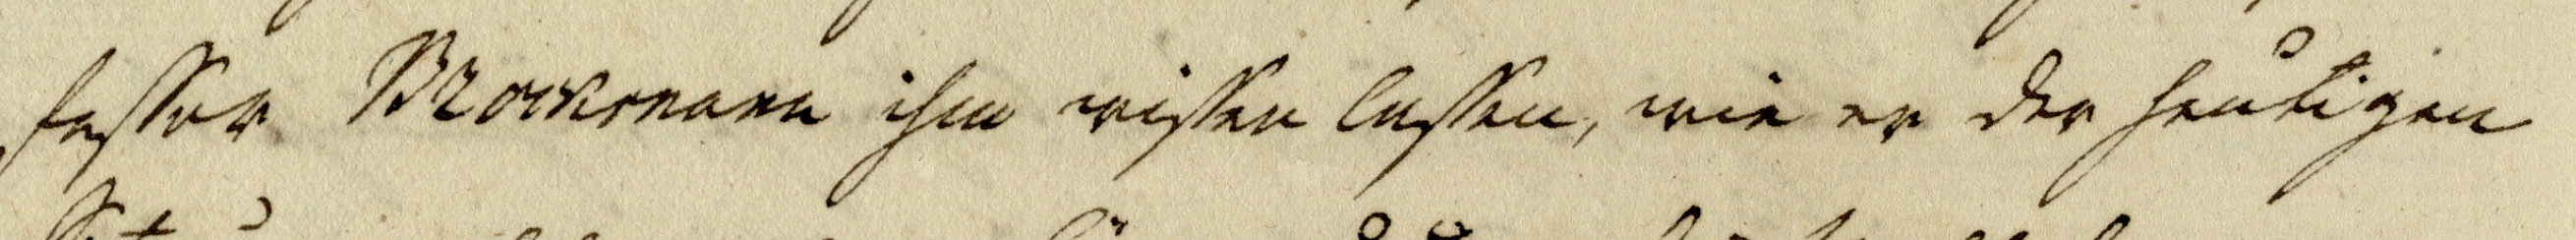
tessor Brockmann ihm wissen lassen, wie er der heutigen
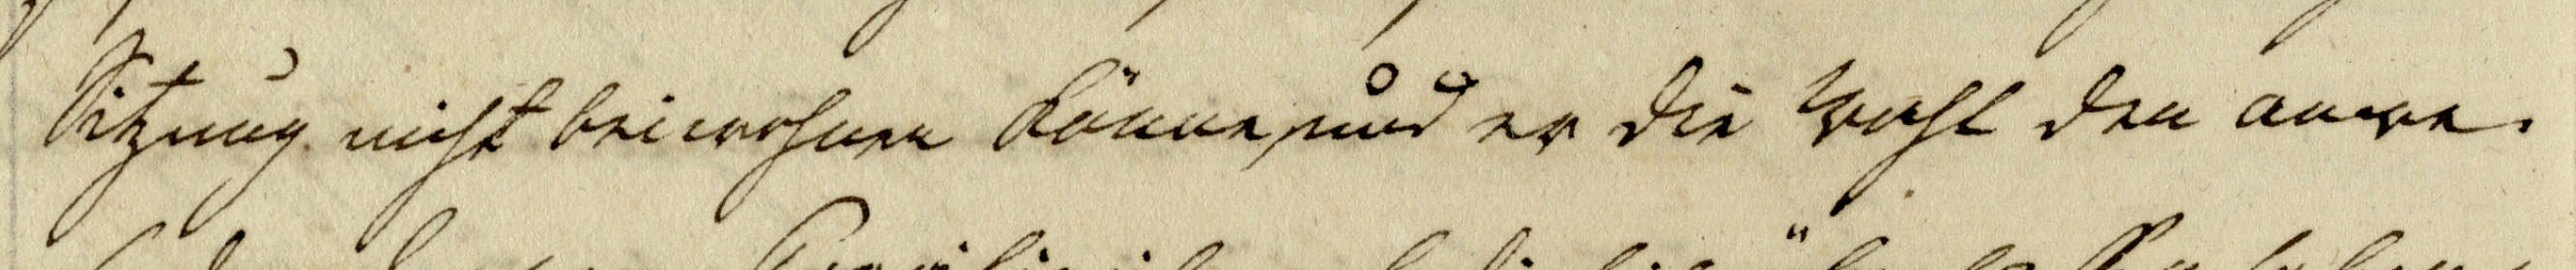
Sitzung nicht bei wohnen könne und er die Wahl den anwe¬
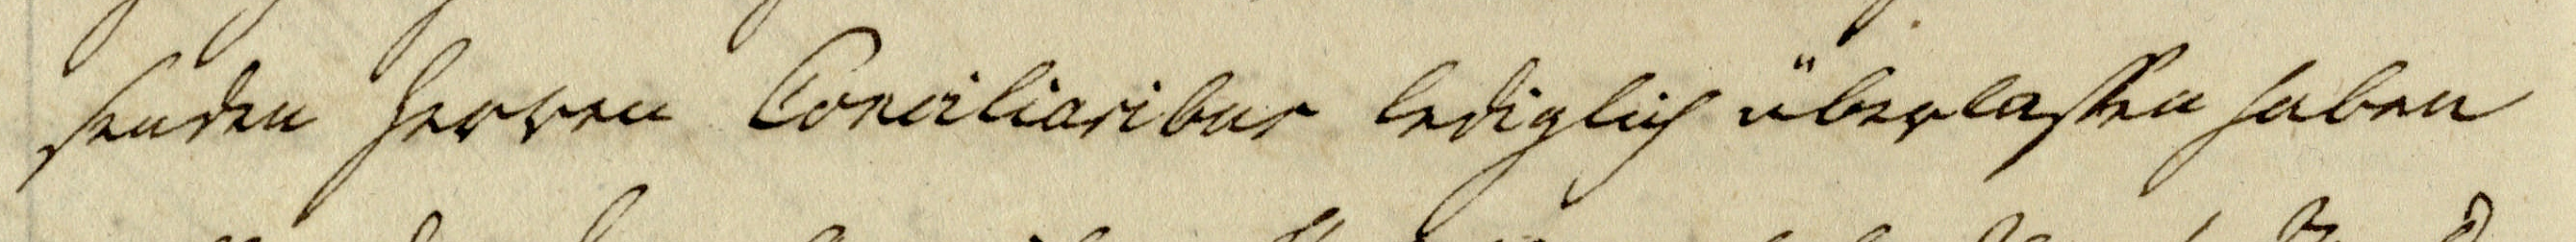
senden Herren Conciliaribus lediglich überlassen haben
